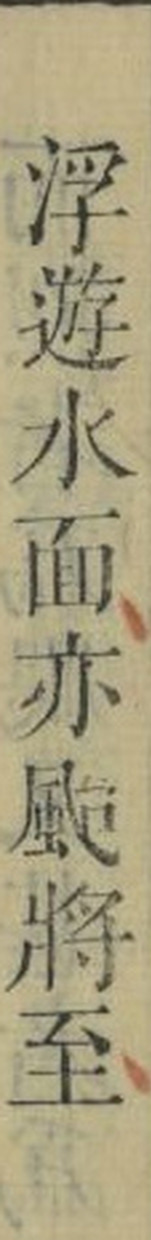浮遊水面亦颱將至
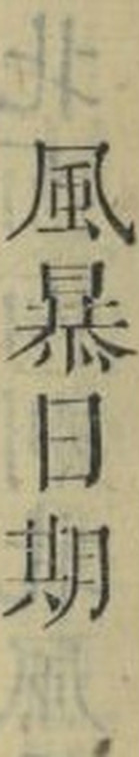風暴日期
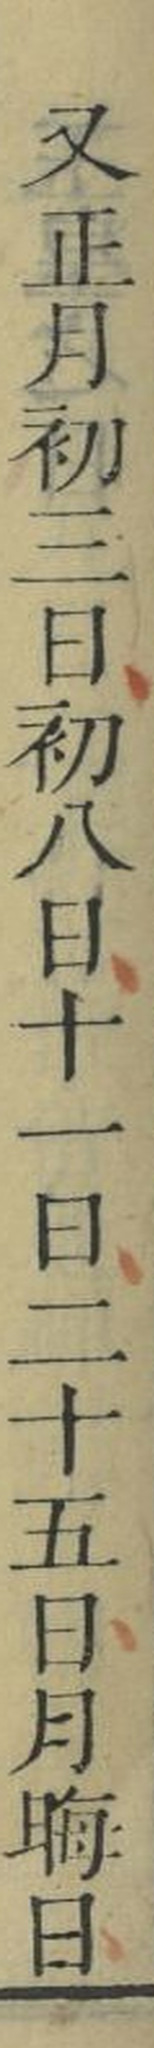又正月初三日初八日十一日二十五日月晦日
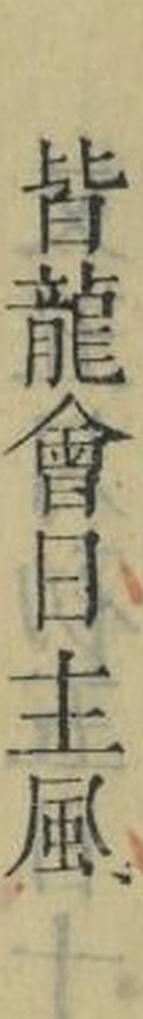皆龍會日主風
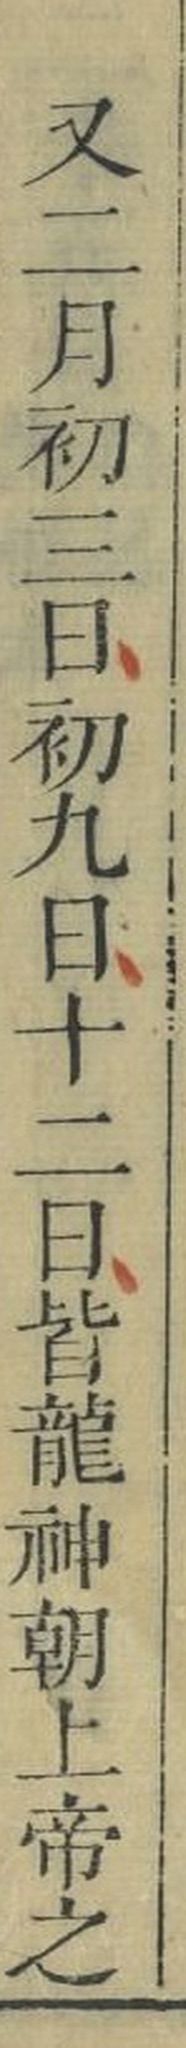又二月初三日初九日十二日皆龍神朝上帝之

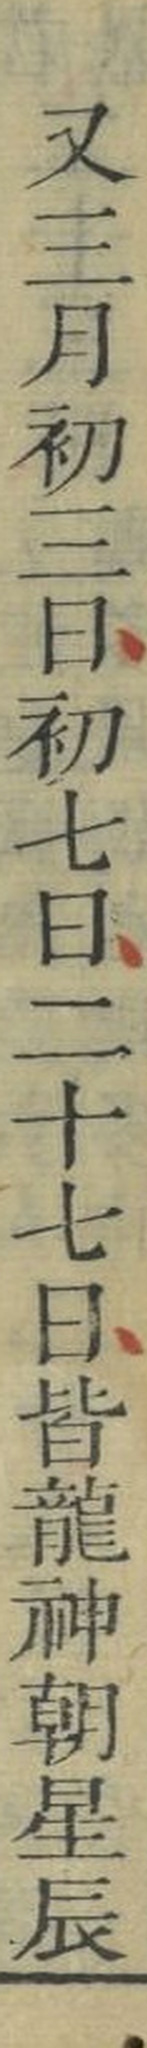又三月初三日初七日二十七日皆龍神朝星辰
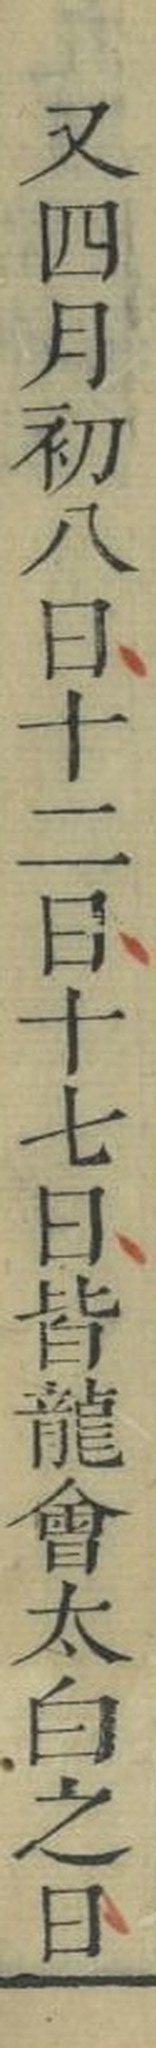又四月初八日十二日十七日皆龍會太白之日
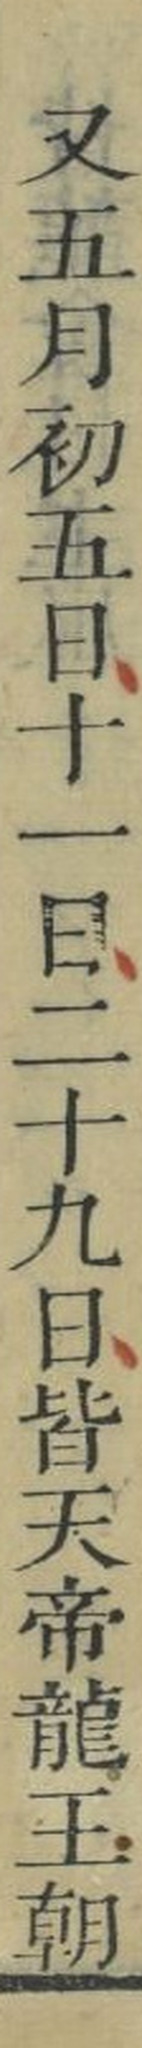又五月初五日十一日二十九日皆天帝龍王朝
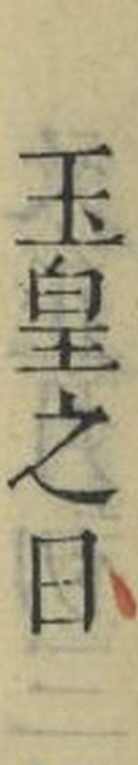玉皇之日
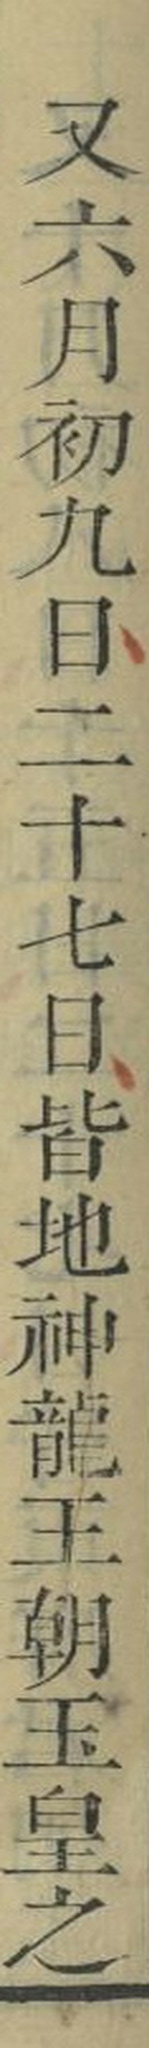又六月初九日二十七日皆地神龍王朝玉皇之
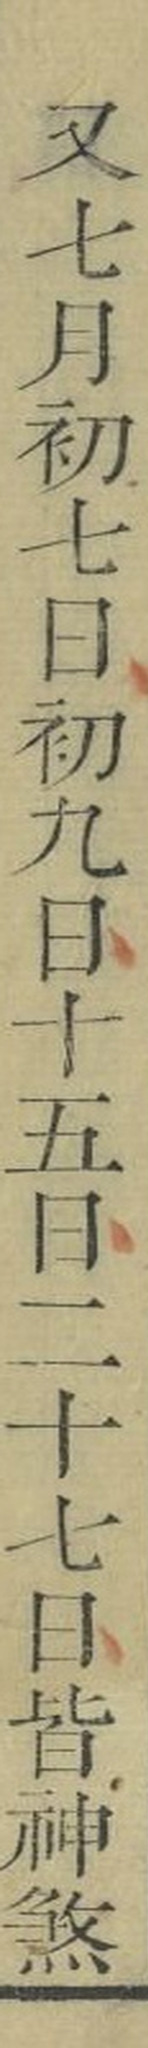又七月初七日初九日十五日二十七日皆神煞
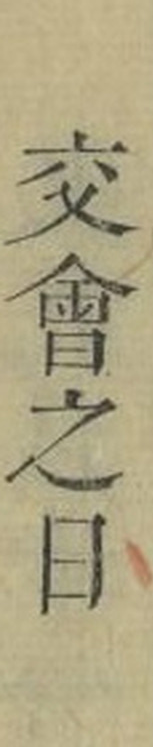交會之日
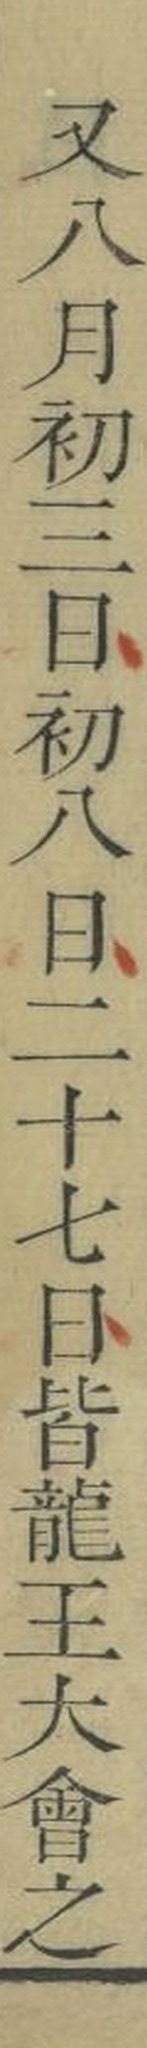又八月初三日初八日二十七日皆龍王大會之

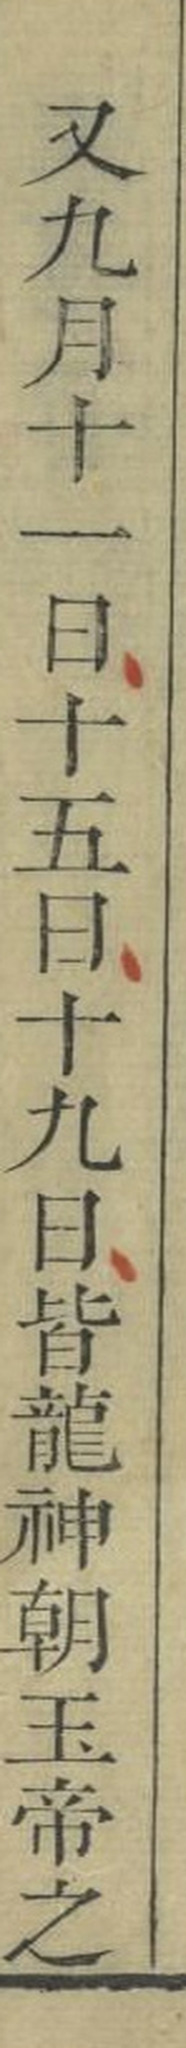又九月十一日十五日十九日皆龍神朝玉帝之
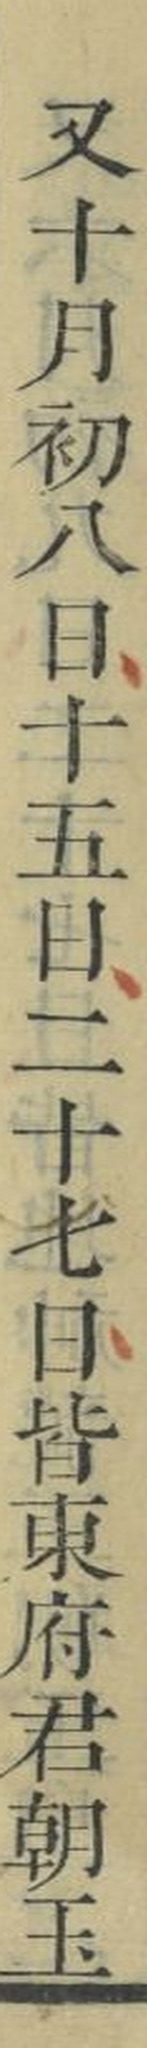又十月初八日十五日二十七日皆東府君朝玉
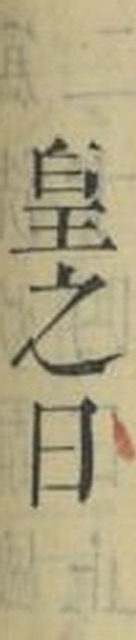皇之日
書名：中山伝信録 巻一、巻二
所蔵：University of the Ryukyus Library
